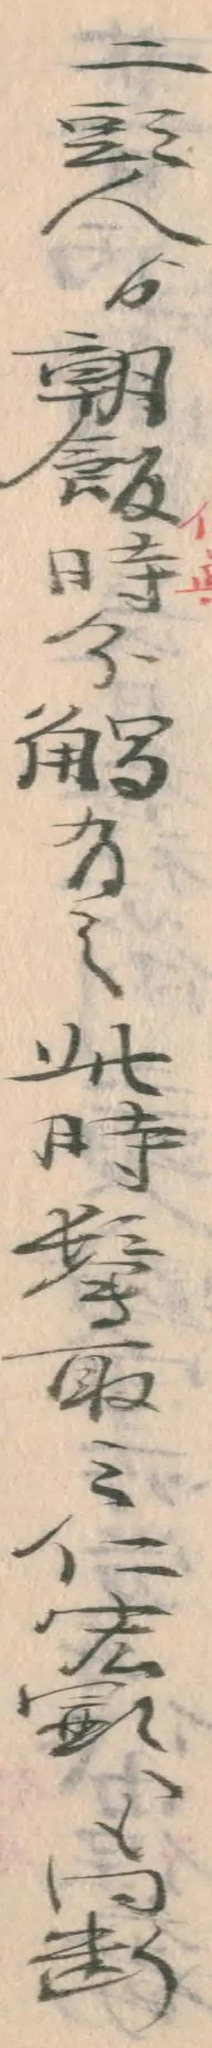二頭人ゟ朝飯時分触有之此時髪取之仁宏顕へも同断
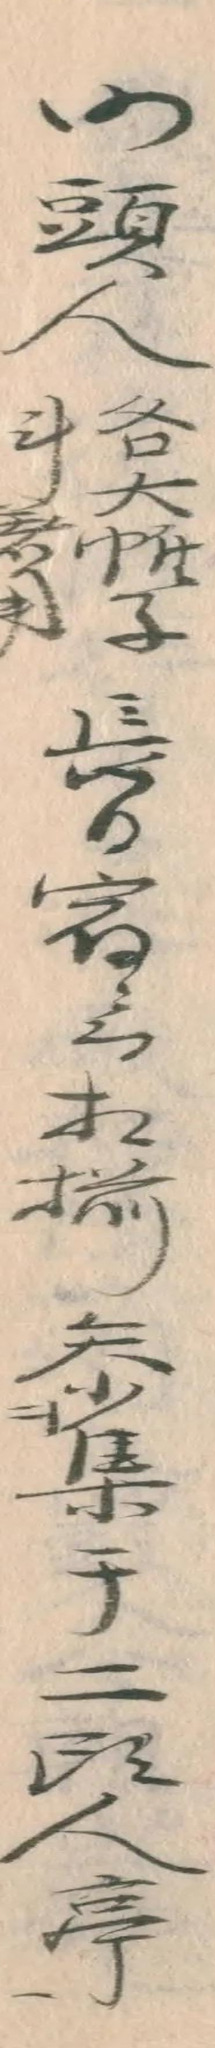仍頭人各大帷子斗着用長日宿ニ而相揃参集于二頭人亭
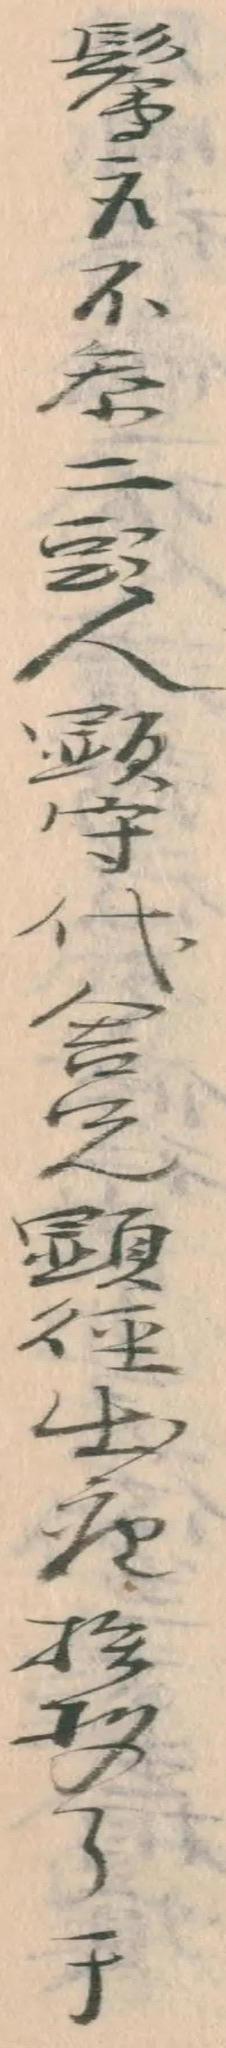髪取不参二頭人顕守代舎兄顕径出座挨拶終了于
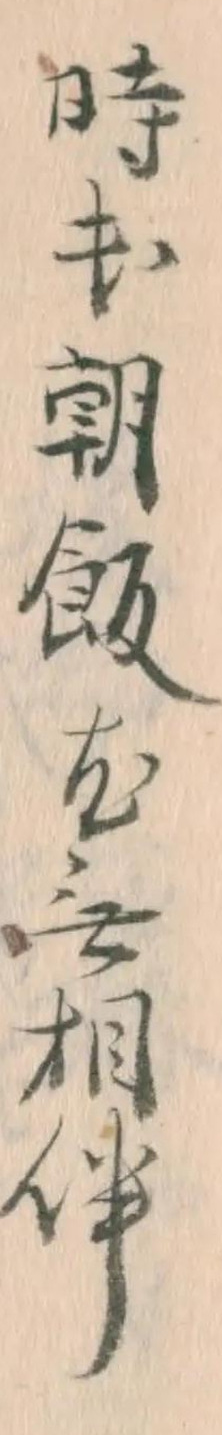時本朝飯尤無相伴
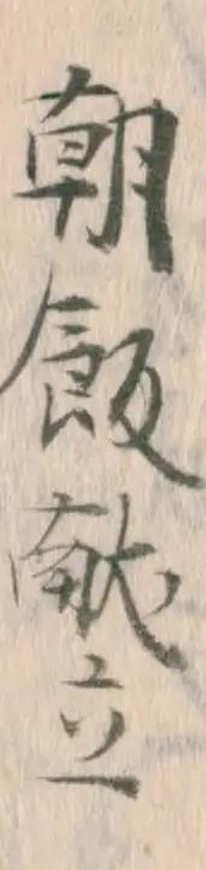朝飯献立
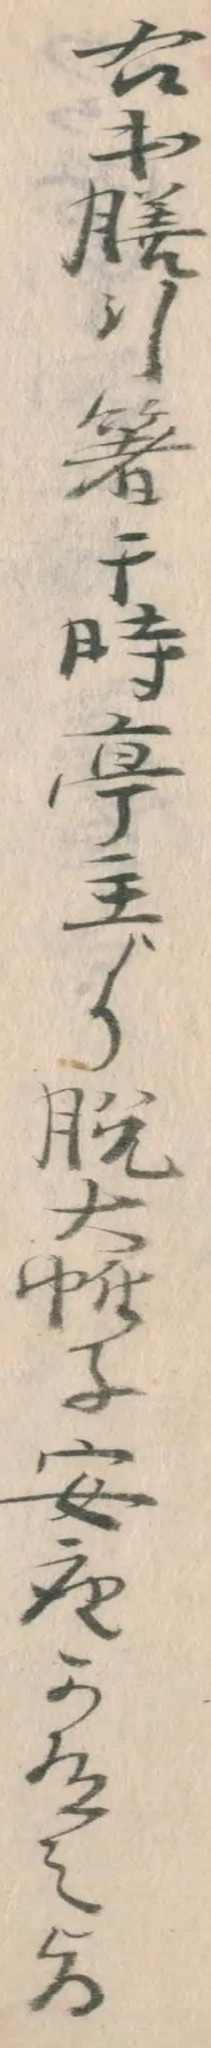右出膳引箸于時亭主より脱大帷子安座可有之旨
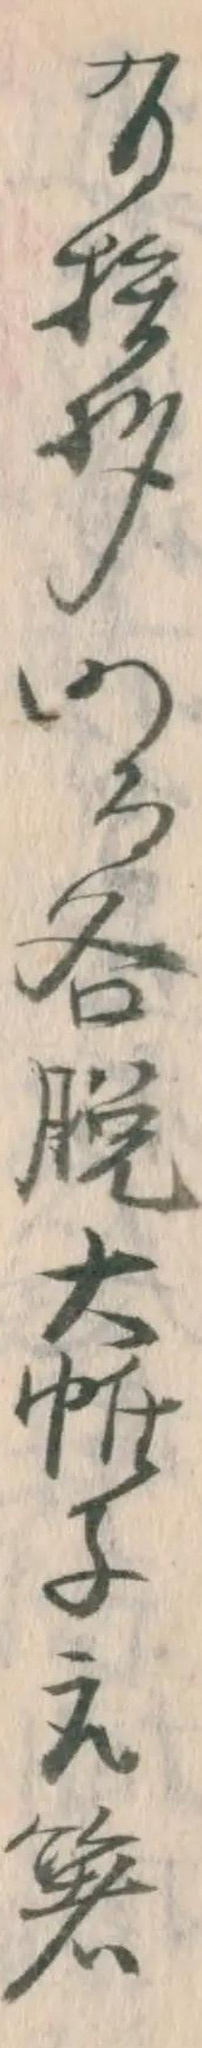有挨拶仍而各脱大帷子取箸

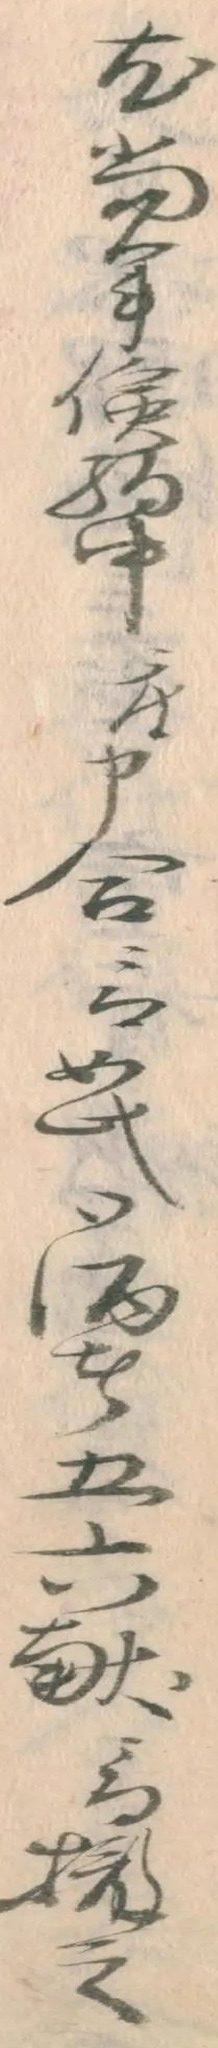尤當年倹約中ニ付申合ニ而如此御酒は五六献ニ而撤之
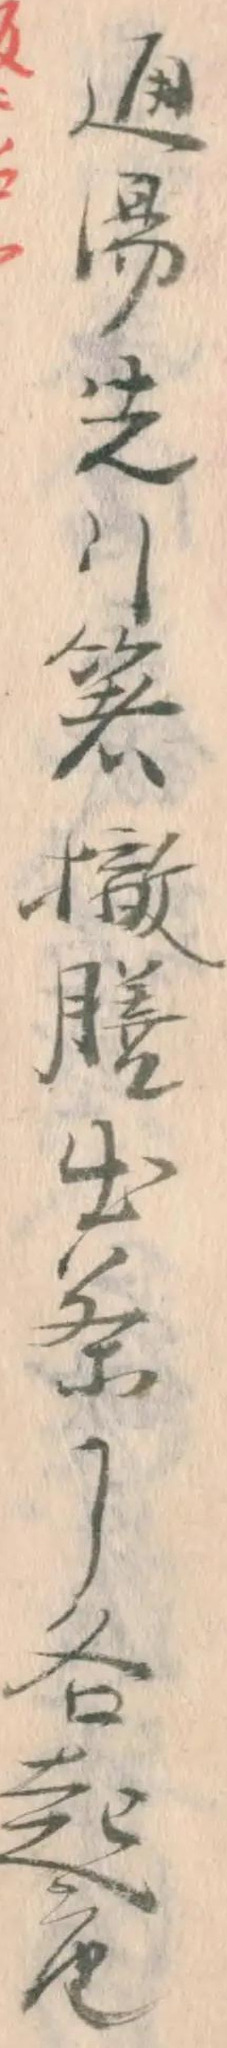通湯先引箸撤膳出茶了各起座
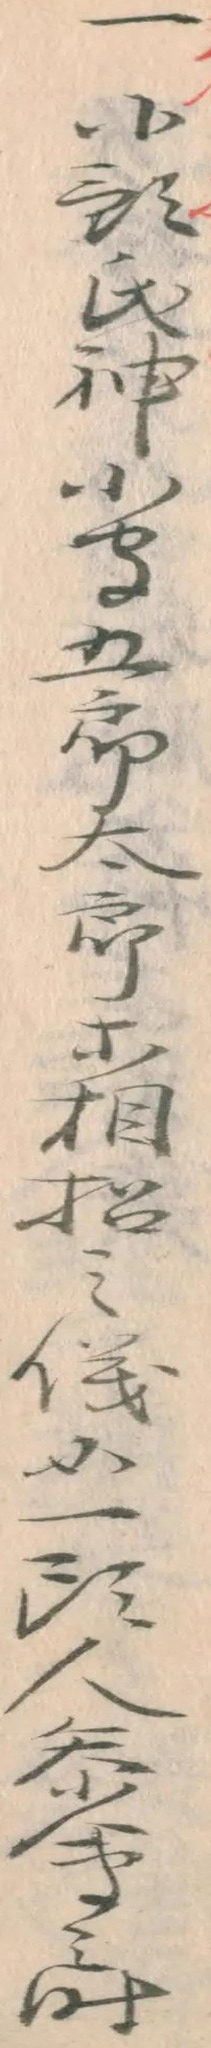一小預氏神小守五郎太郎等相招之儀如一頭人参會之時
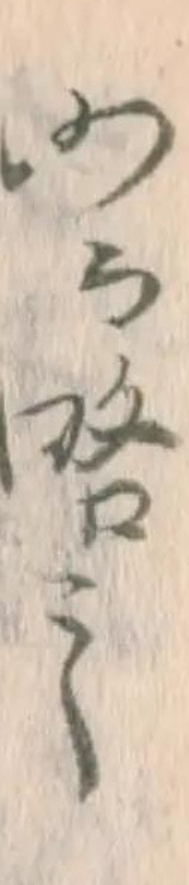仍而略之
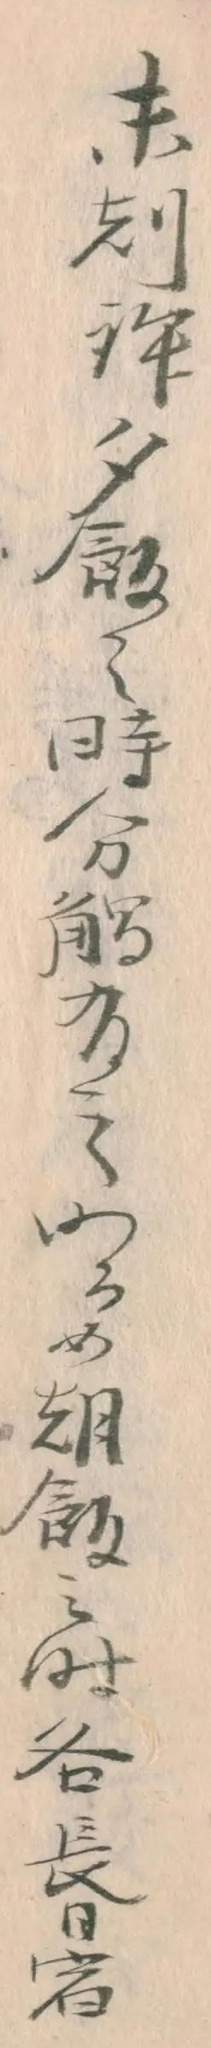一未刻許夕飯之時分触有之仍而如朝飯之助各長日宿
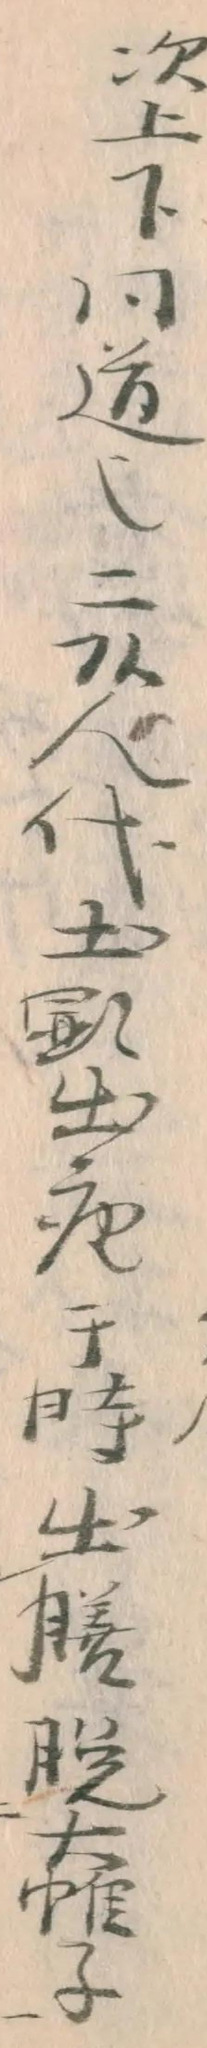次上下同道也二頭人代土顕出座于時出膳脱大帷子
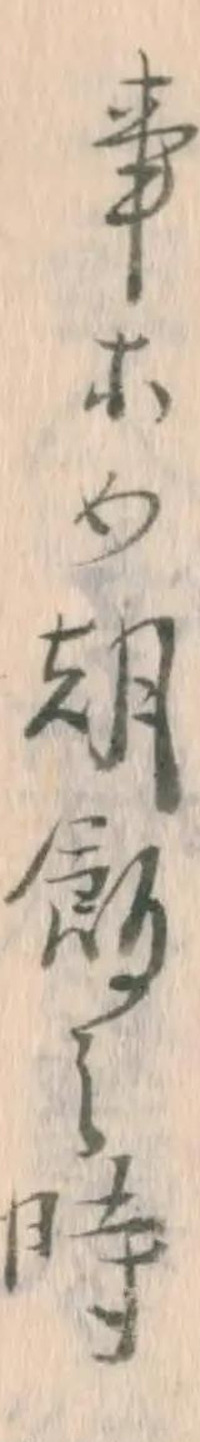事等ゟ朝飯之時
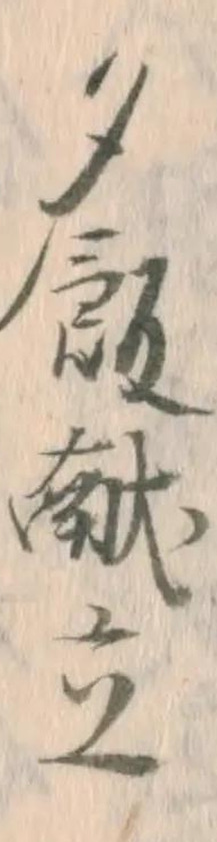夕飯献立
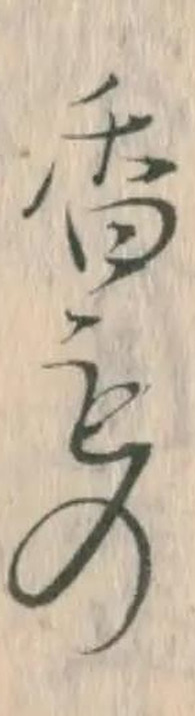香もの
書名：賀茂社記録. 第73冊
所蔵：国立国会図書館 National Diet Library, JAPAN
